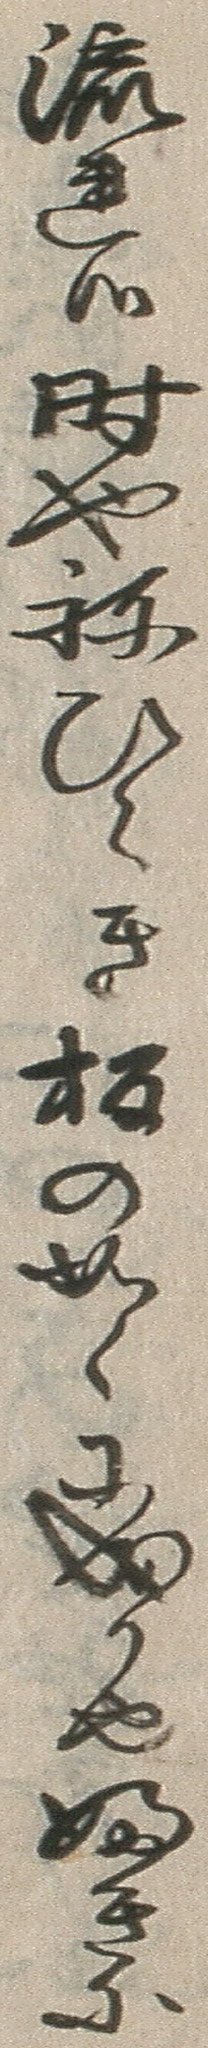流れ候時やねひくき板の如くに成かやふきに
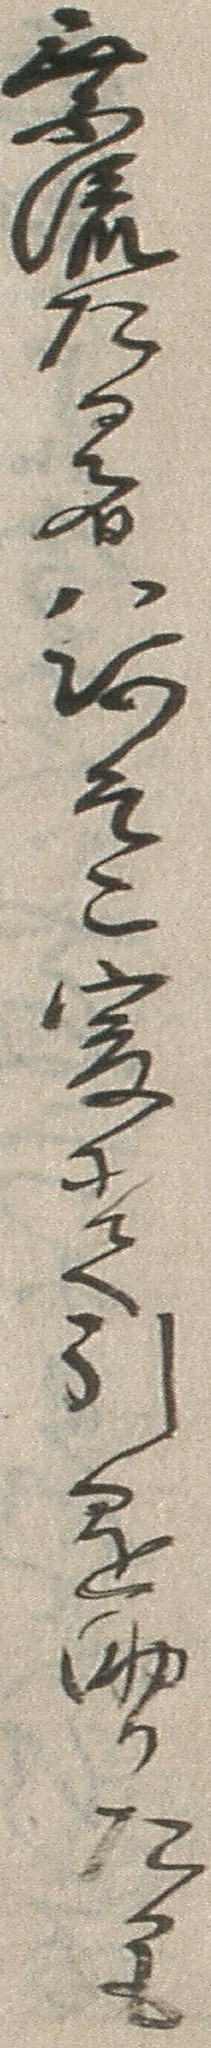乗流たる者はあそこ爰にて引懸助りたるも
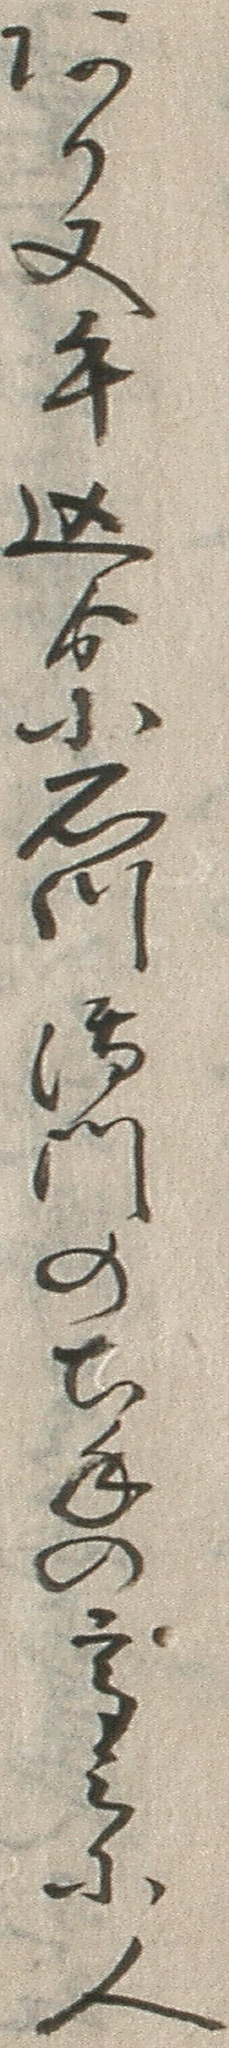あり又午込ゟ小石川御門の土手の高みに人
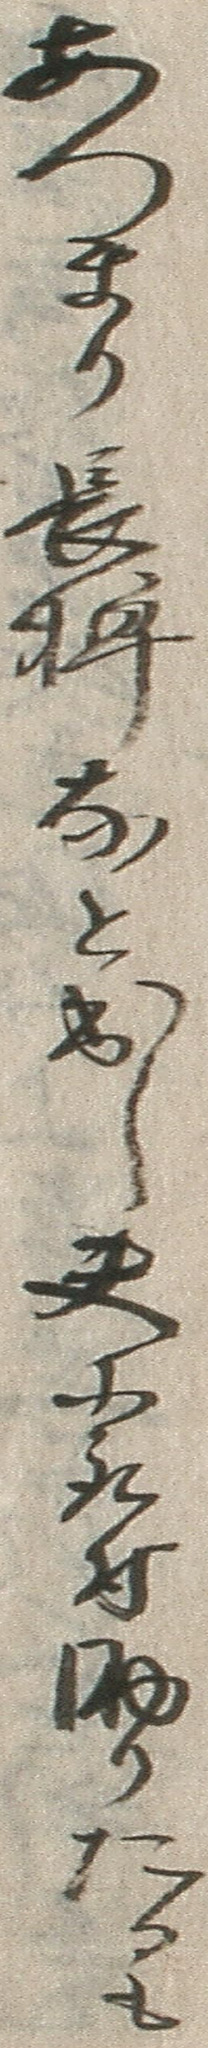あつまり長棹なと出し夫に取付助りたるも
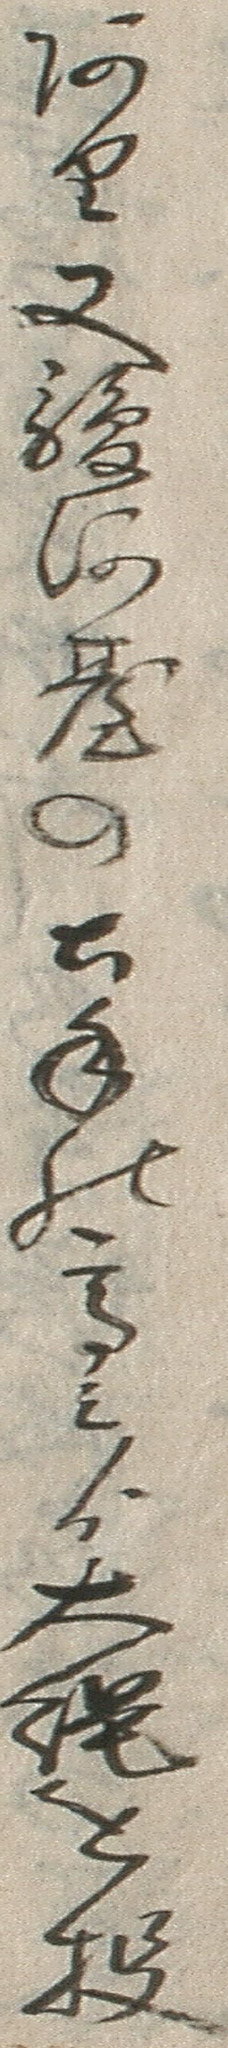あり又駿河台の土手の高みゟ大縄を投
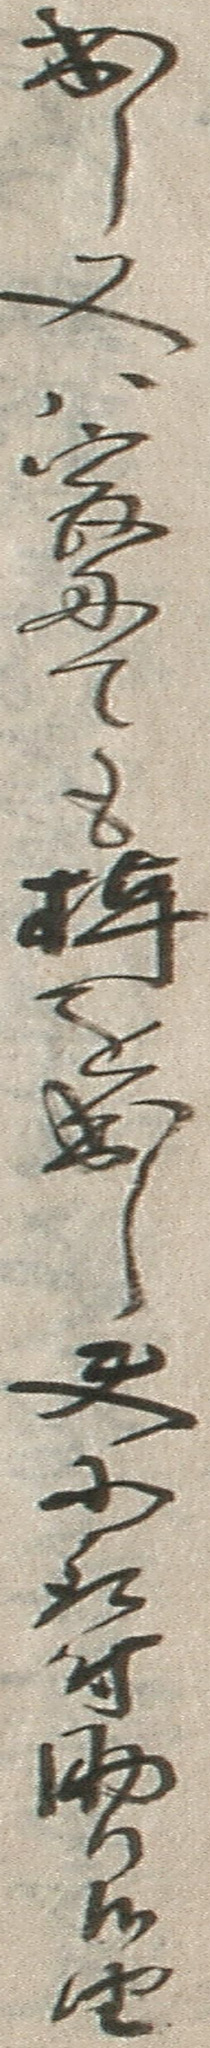出し又は爰にても棹を出し夫に取付助り候由
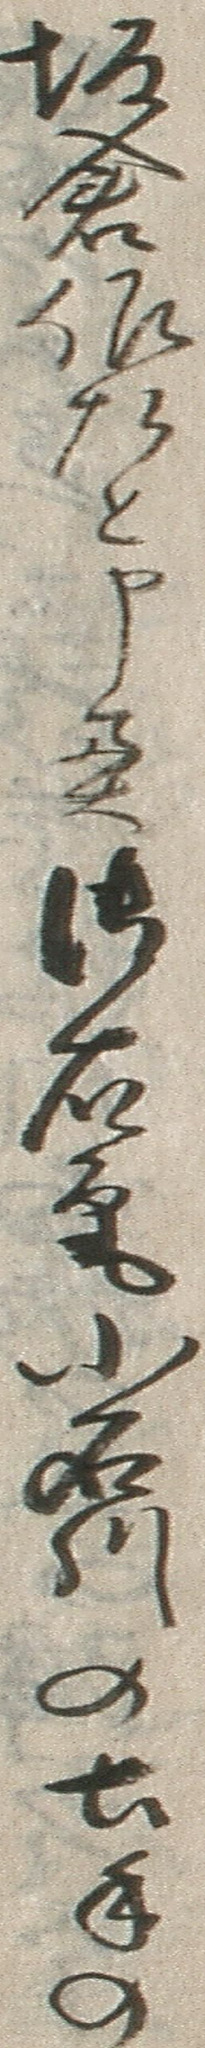坂倉作たと申奥御右筆小石川の土手の
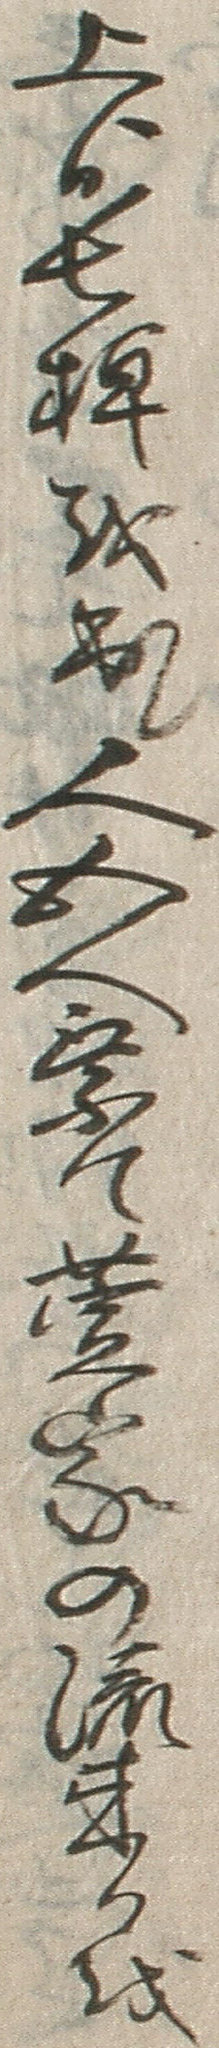上ゟ長棹を出し人五人乗て萱家の流来るを

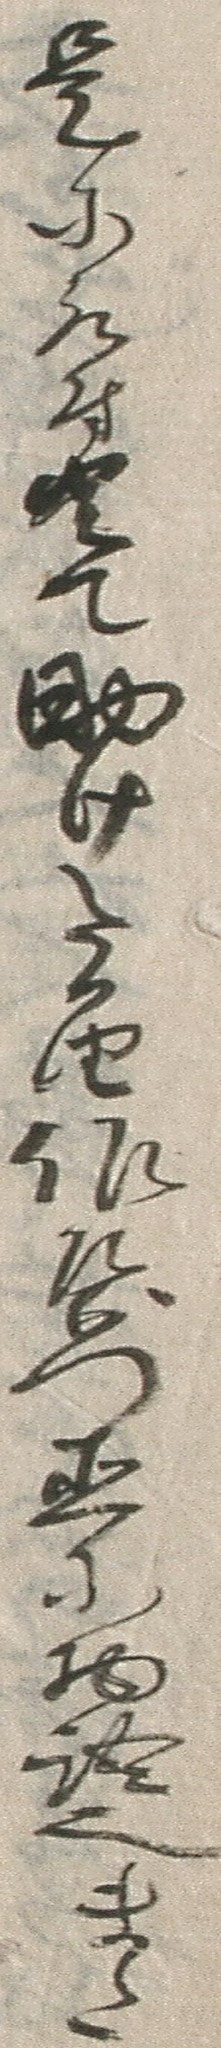是に取付とて助けたる由作左衛門直に物語也また
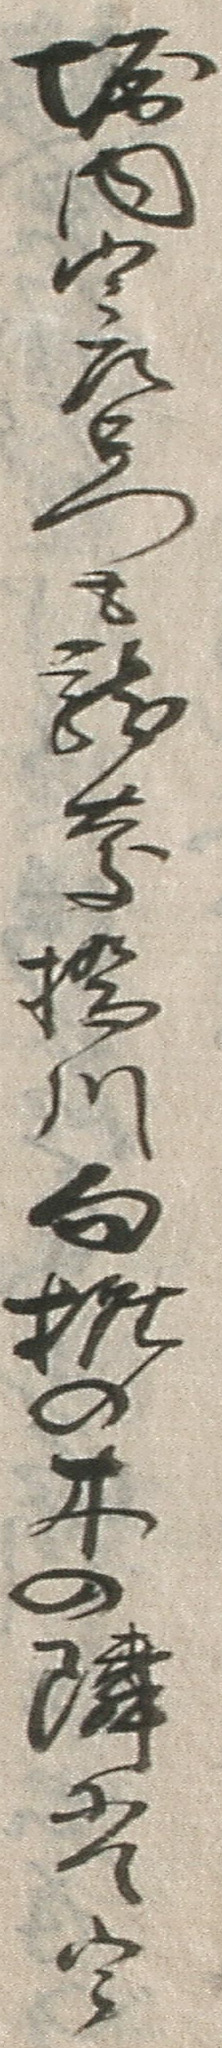堀内宇左衛門も龍慶橋川向椎の木の隣にて宇
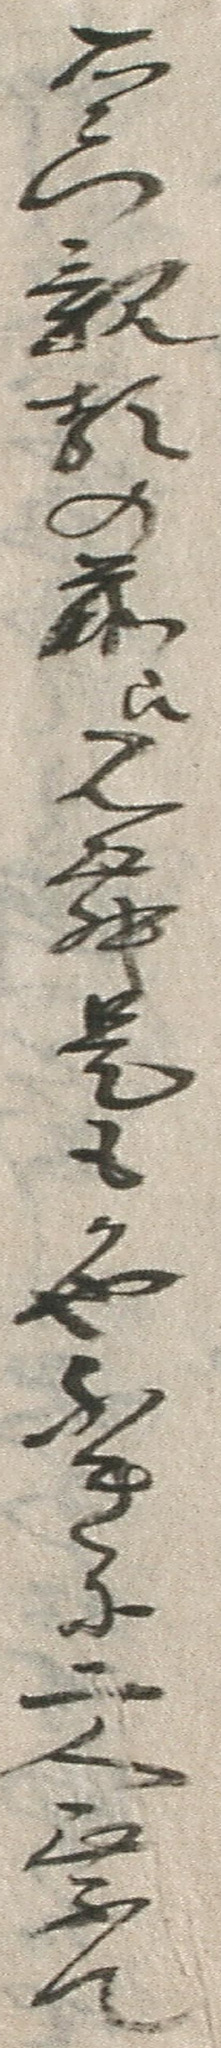右衛門親類の前江見舞是もかやふきに二人乗て
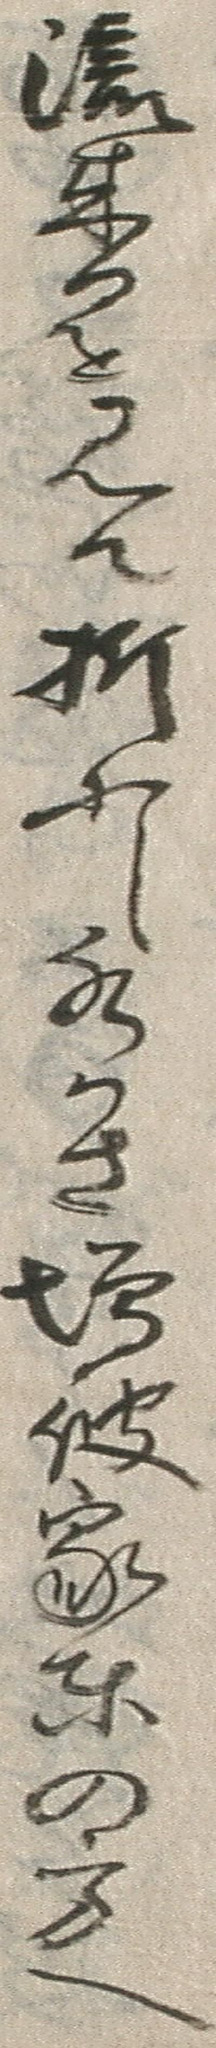流来るを見て折ふし水かさ増彼家東の方へ
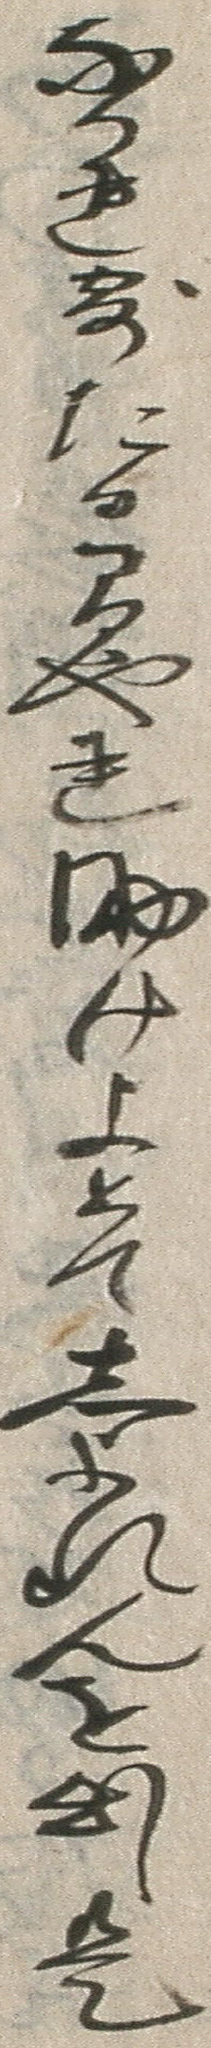なかれ寄たる間やれ助けよとてしよれんを出し是
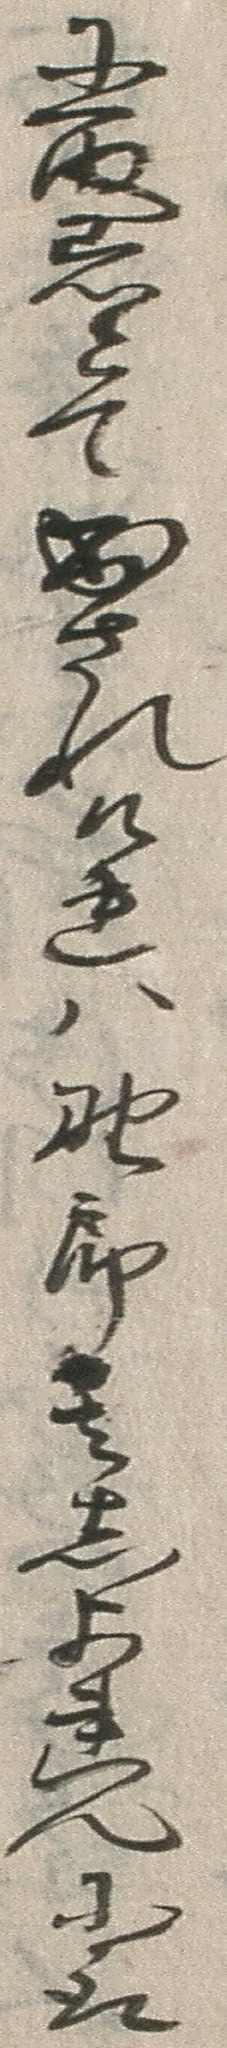に取着とて出されけれは野郎其しよれんに取
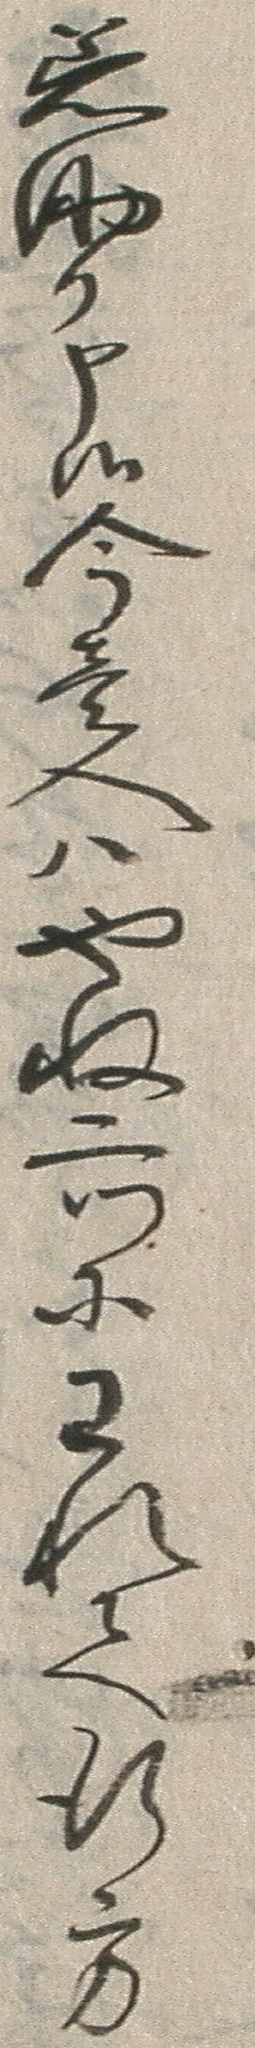着助り申候今壱人はやね二ツにわれて行方
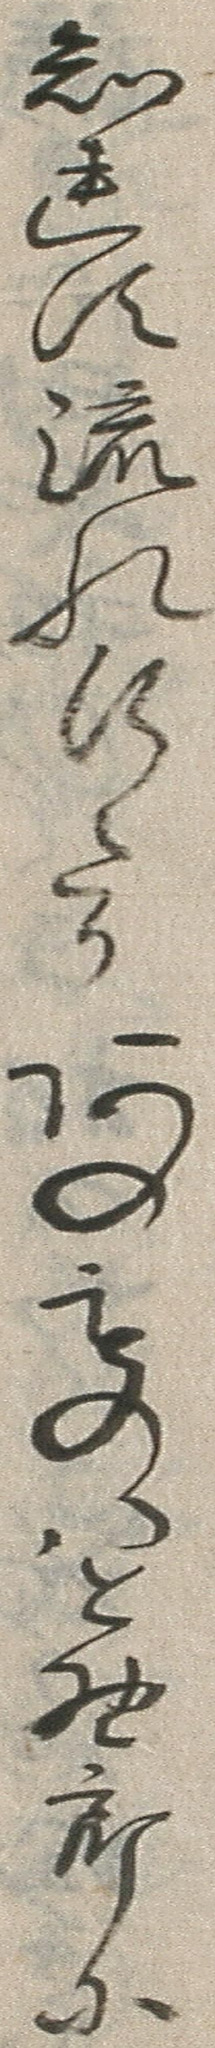知れす流れ行たりあのものはと野郎に
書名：享保十三年江戸洪水記
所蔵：東京大学地震研究所図書室 Earthquake Research Institute Library, The University of Tokyo, JAPAN
